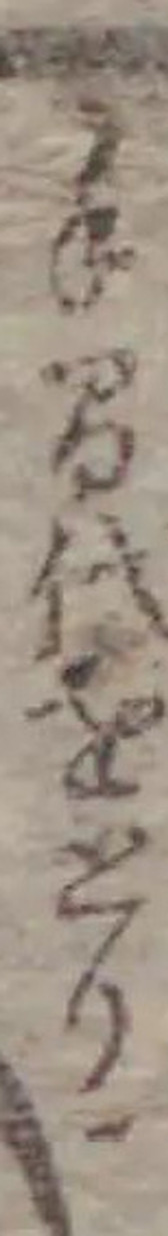手間代をとり
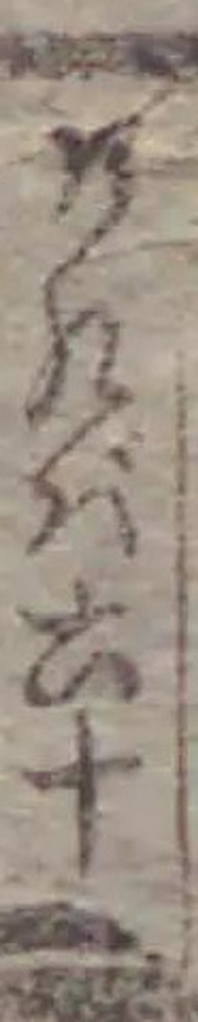ければ六十
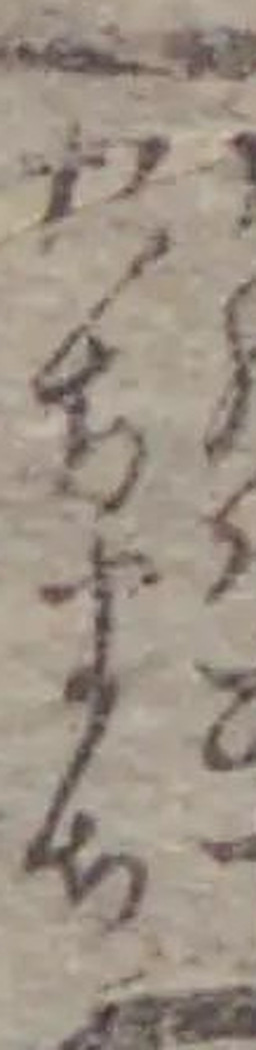たちまち
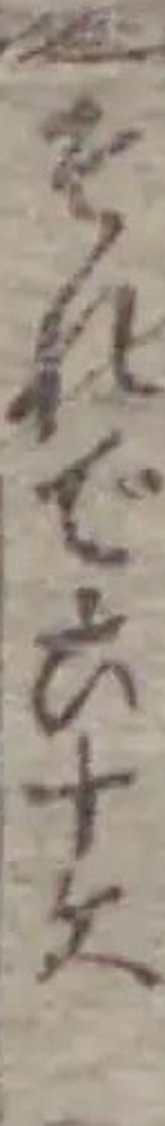それで六十文
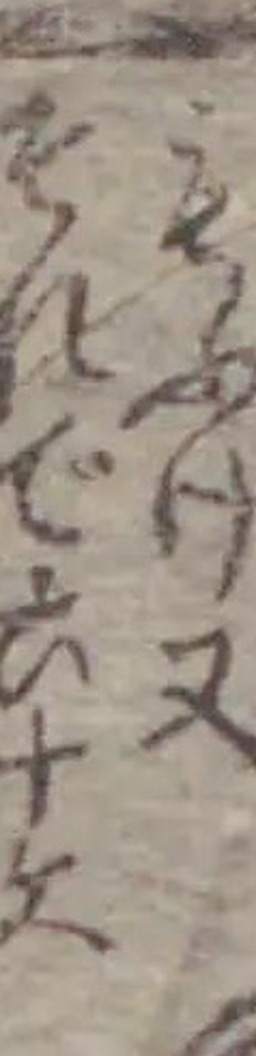それで六十文
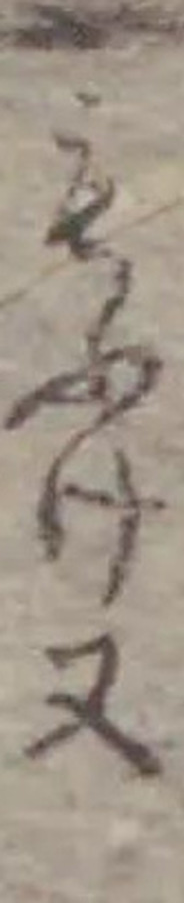もふけ又
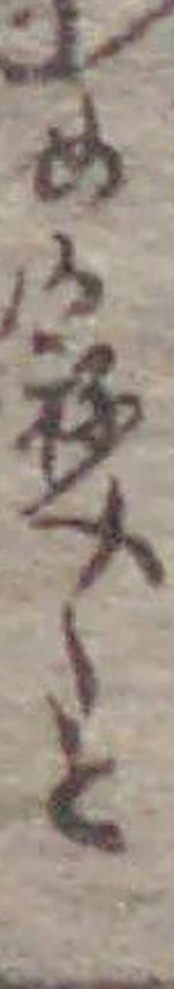めかねへ〳〵と
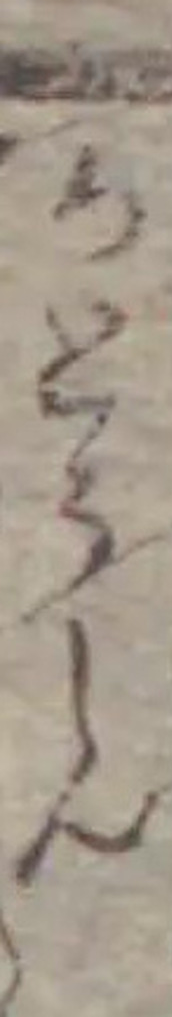かとうしん
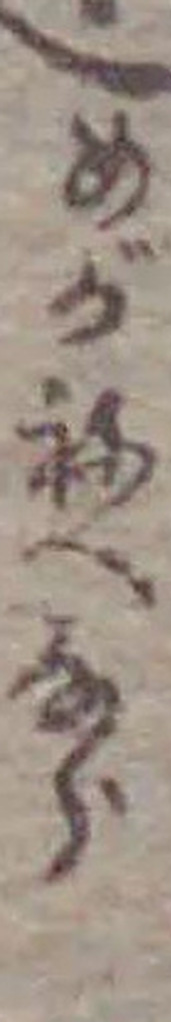めがねへなら
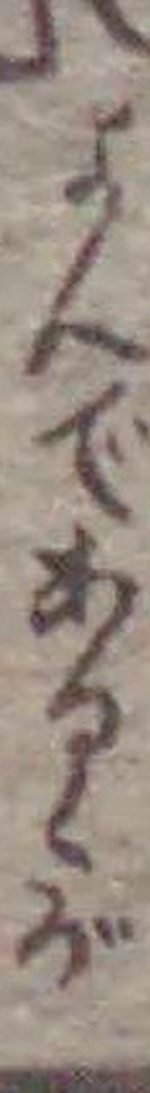よんであるくが
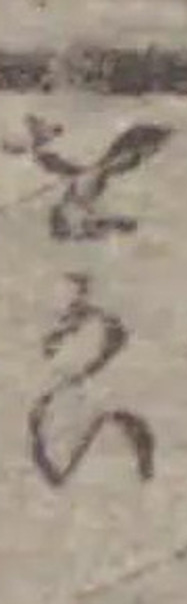をかい
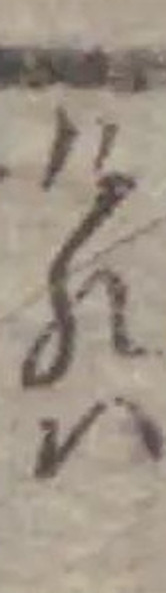けれは
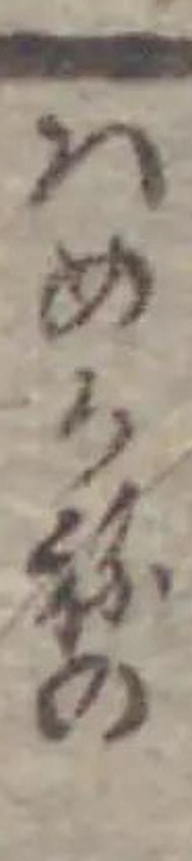はめかねの
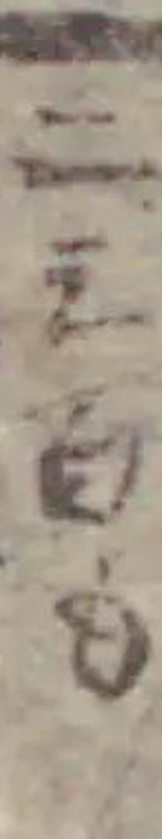二三百も
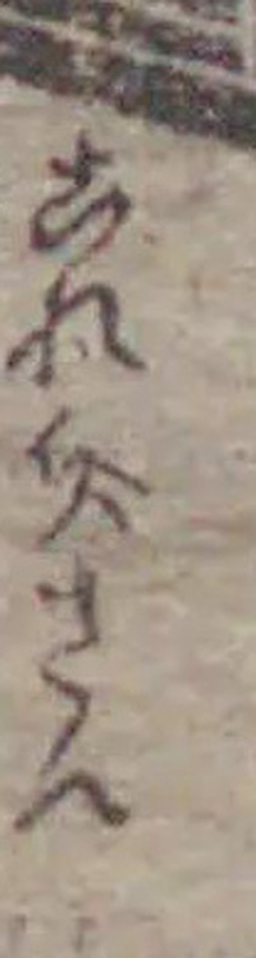これ介さん
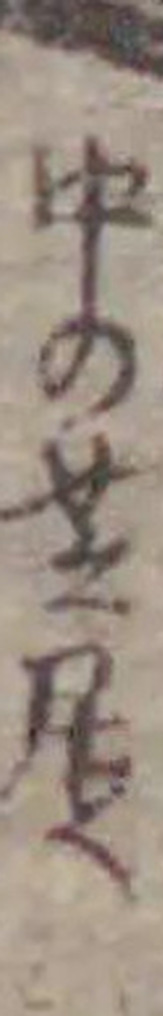中の芝居へ
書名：栄増眼鏡徳 3巻
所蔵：国立国会図書館 National Diet Library, JAPAN
